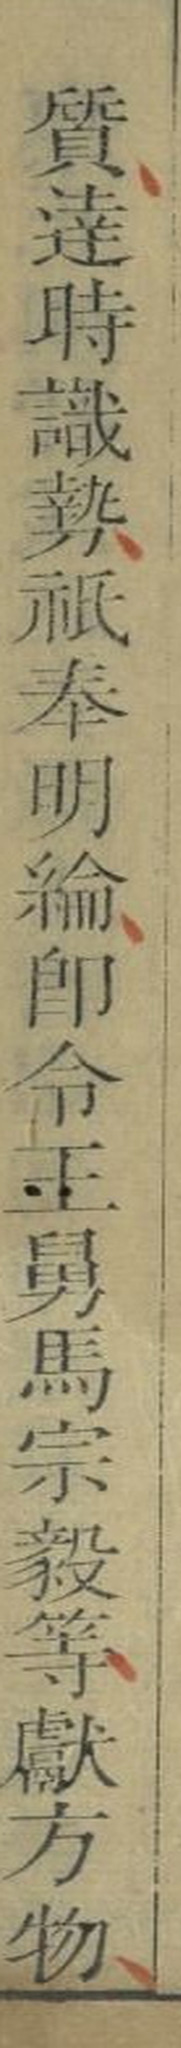質達時識勢祇奉明綸即令王舅馬宗毅等献方物

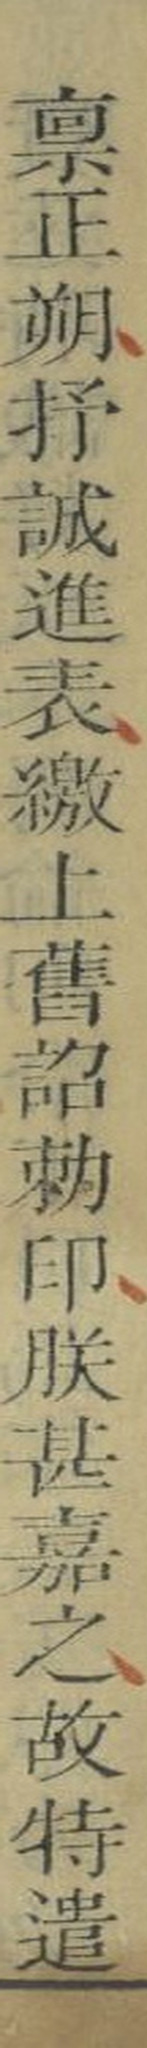稟正朔抒誠進表繳上旧詔勅印朕甚嘉之故特遣
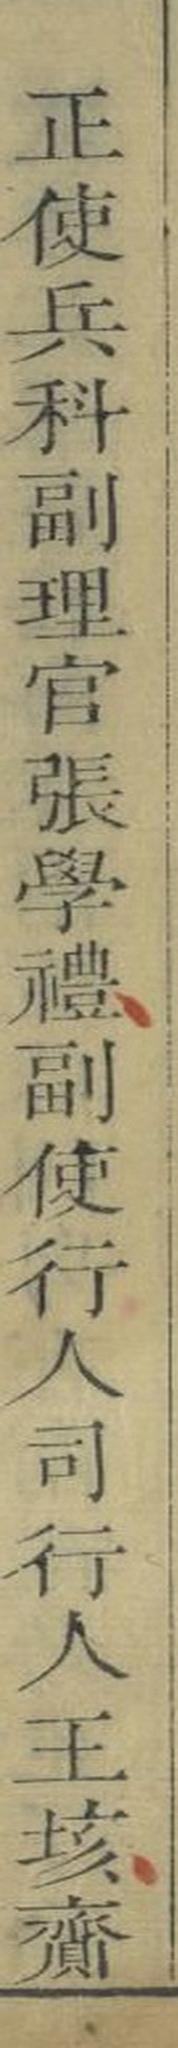正使兵科副理官張学礼副使行人司行人王垓齎
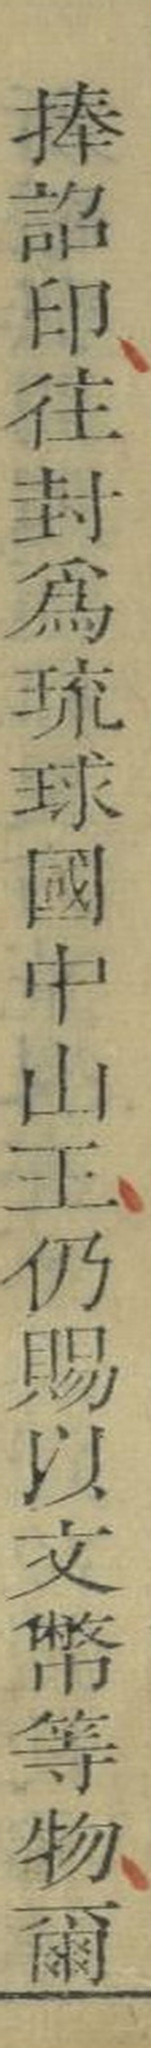捧詔印往封為琉球国中山王仍賜以文幣等物爾
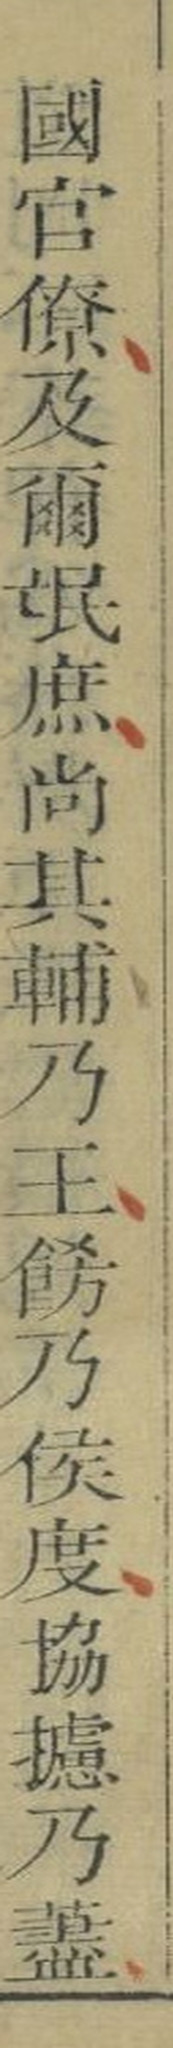国官僚及爾氓庶尚其輔乃王飾乃侯度協攄乃藎
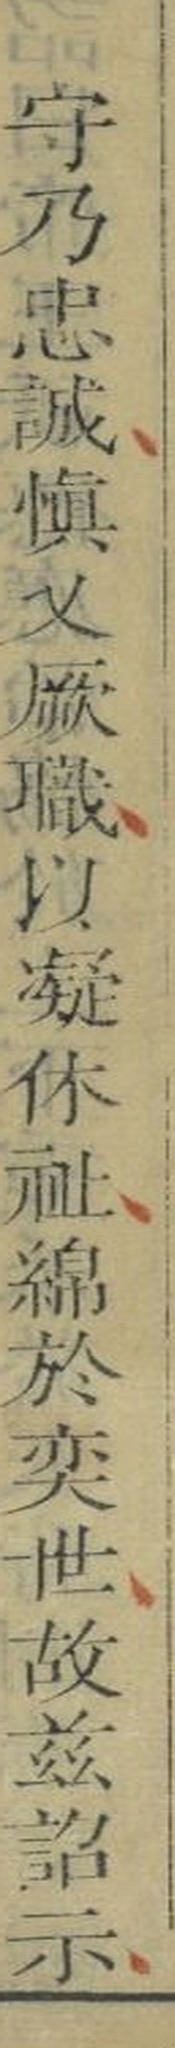守乃忠誠慎乂厥職以凝休祉綿於奕世故茲詔示
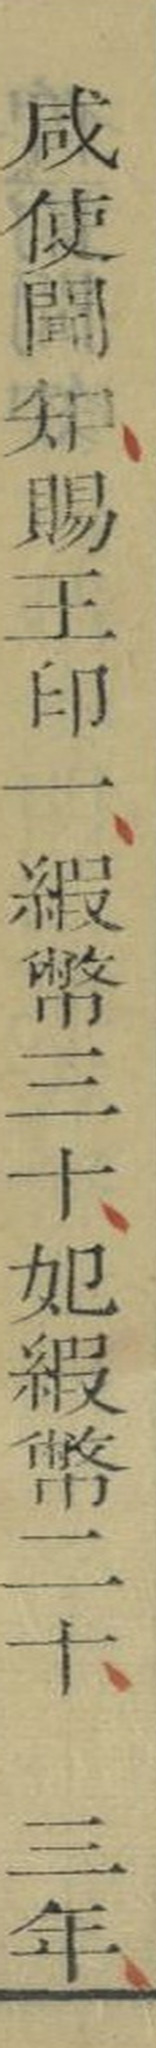咸使聞知賜王印一緞幣三十妃緞幣二十三年
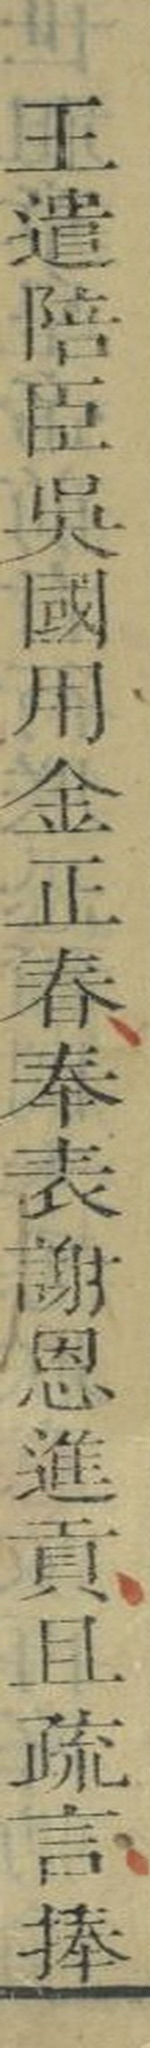王遣陪臣呉国用金正春奉表謝恩進貢且疏言捧
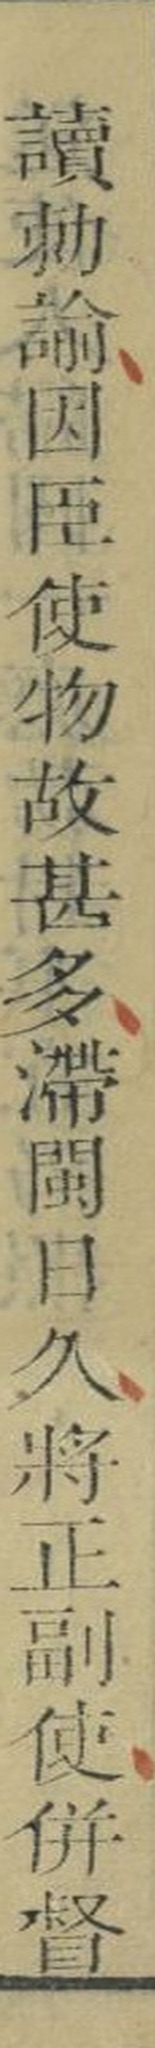読勅諭因臣使物故甚多滞閩日久将正副使併督
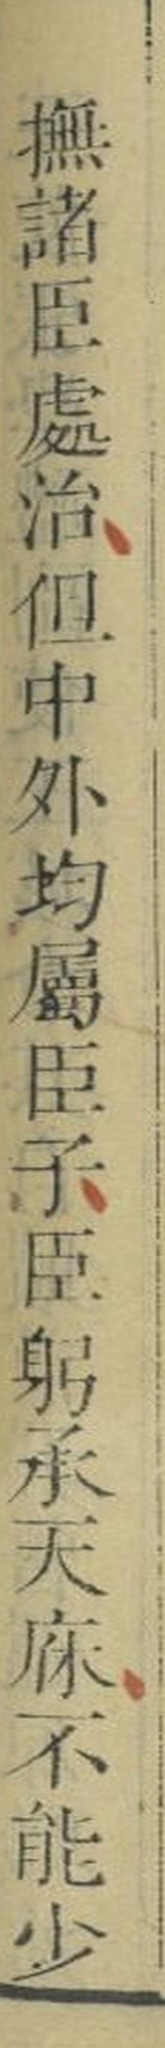撫諸臣処治但中外均属臣子臣躬承天庥不能少
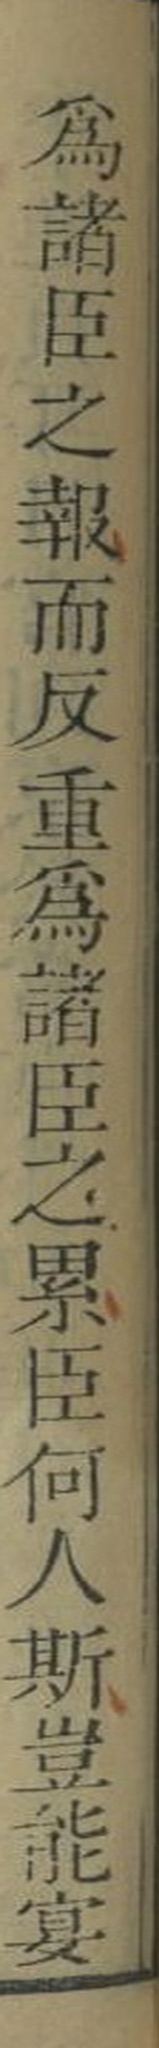為諸臣之報而反重為諸臣之累臣何人斯豈能宴
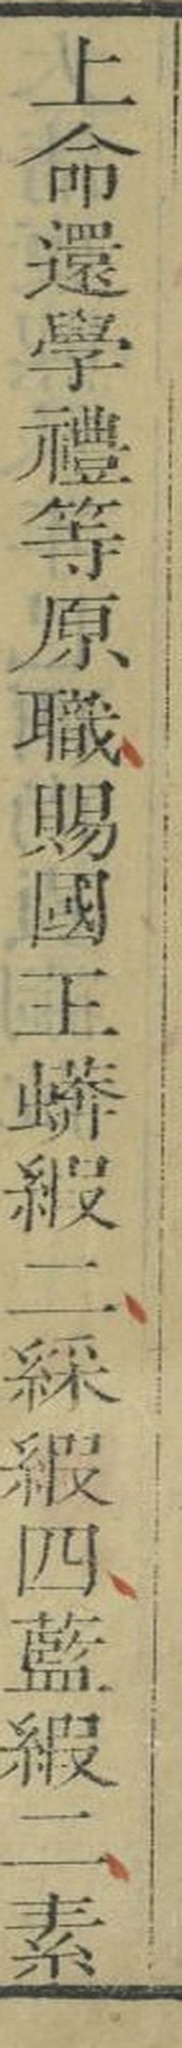上命還学礼等原職賜国王蠎緞二綵緞四藍緞二素
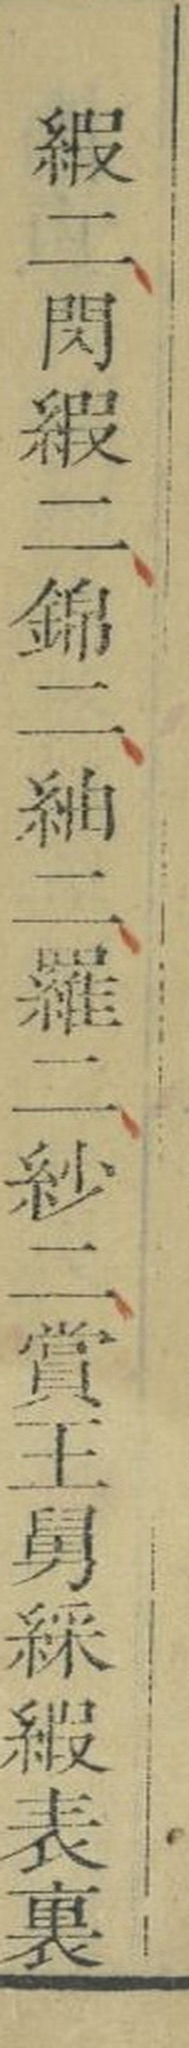緞二緞二錦二紬二羅二紗二賞王舅綵緞表裏
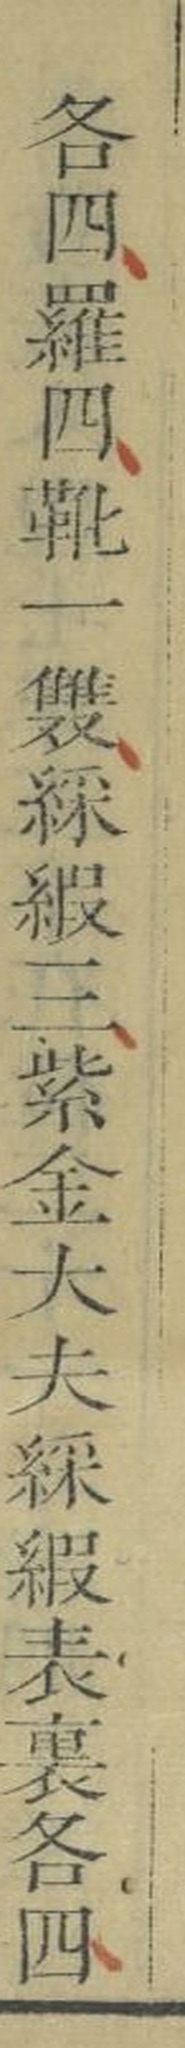各四羅四靴一双綵緞三紫金大夫綵緞表裏各四
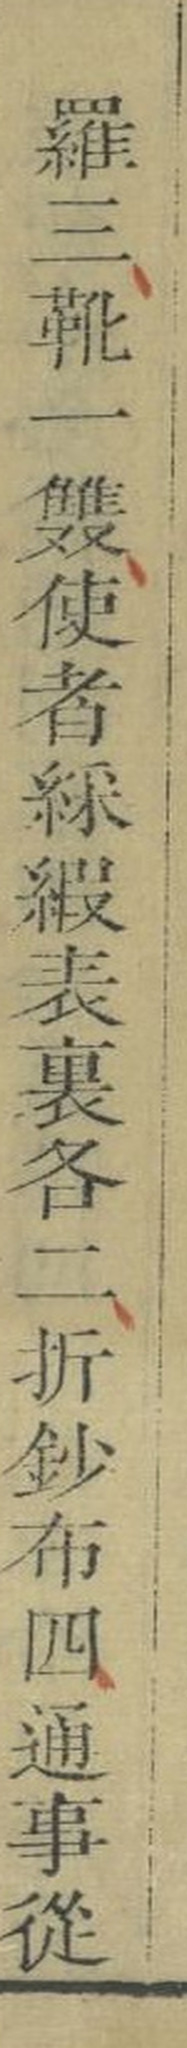羅三靴一双使者綵緞表裏各二折鈔布四通事従
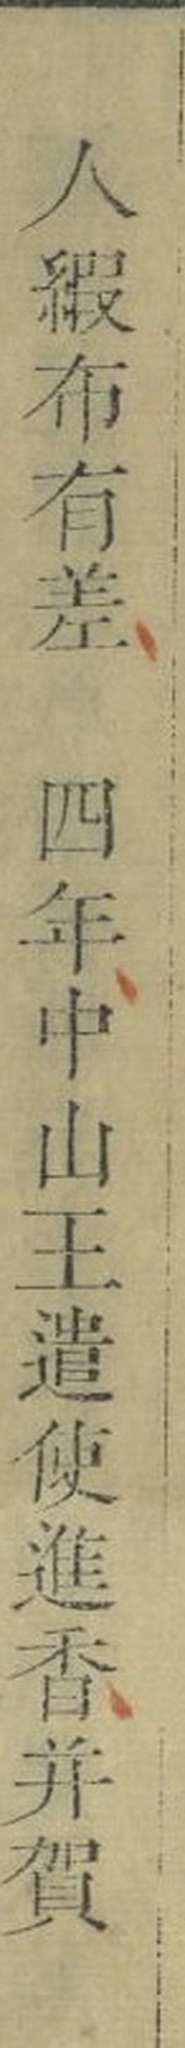人緞布有差四年中山王遣使進香幷賀
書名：中山伝信録 巻三
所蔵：University of the Ryukyus Library
